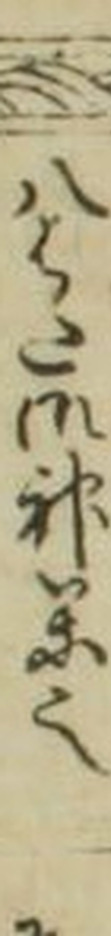八はた御神楽也
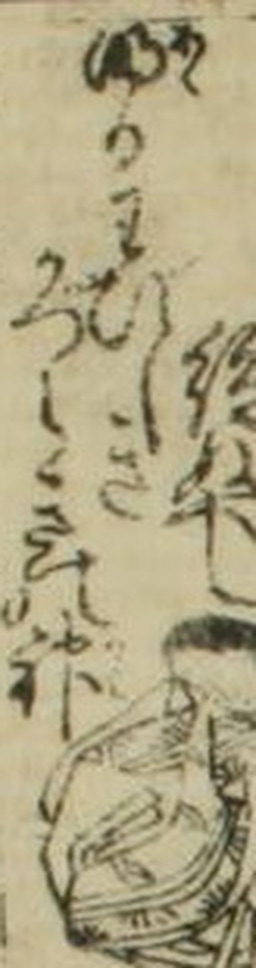かづらきの神
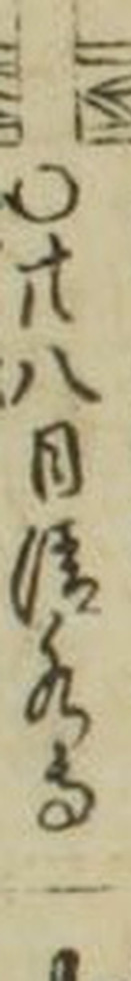○廿八日清水寺
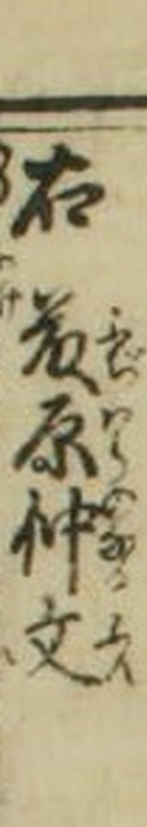右藤原仲文
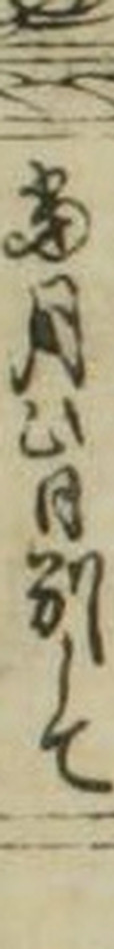当月此日別して
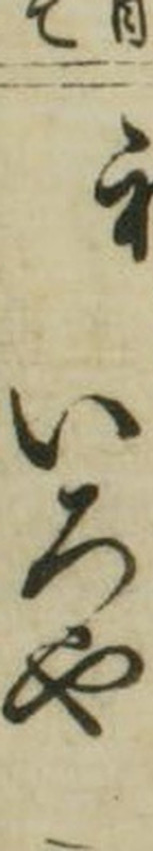いろや
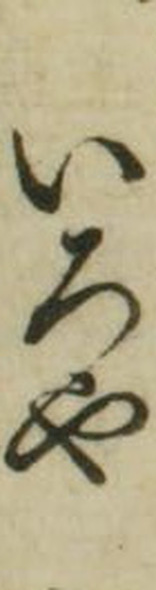いろや
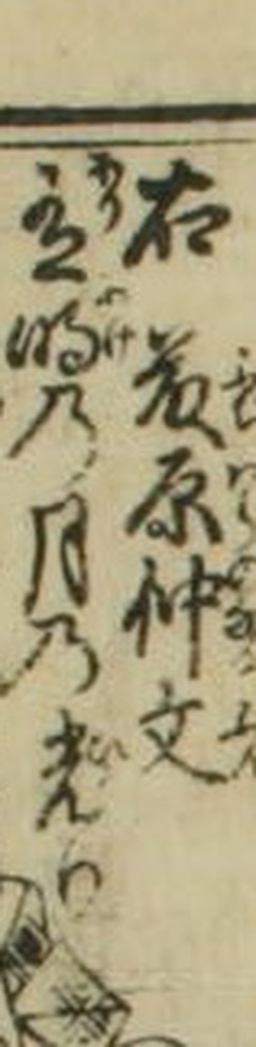有明の月の光り
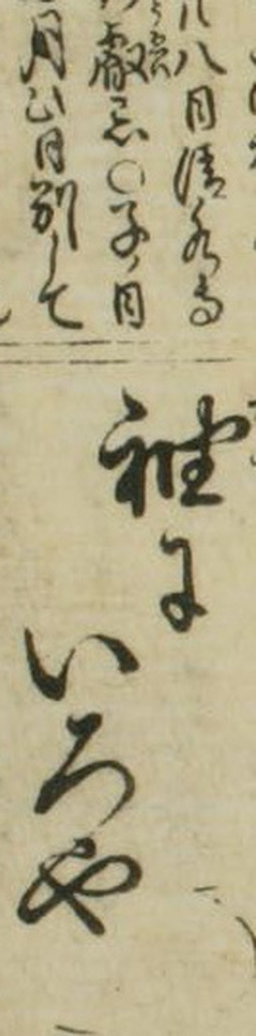いろや
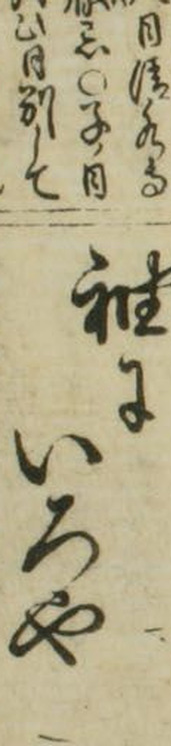いろや
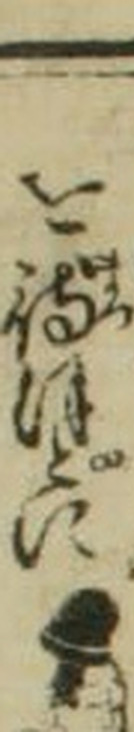を待ほどに
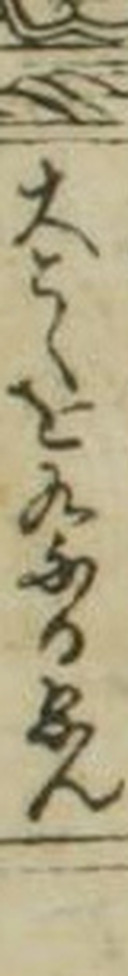大こくを祭るゑん
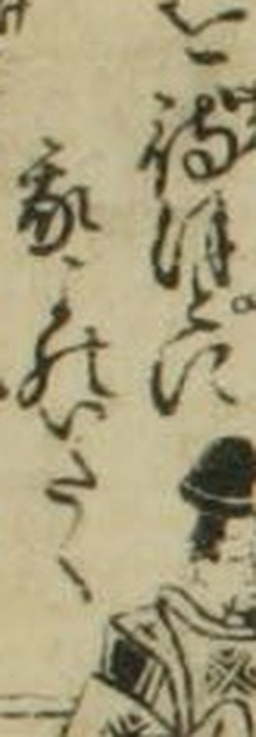我よのいたく
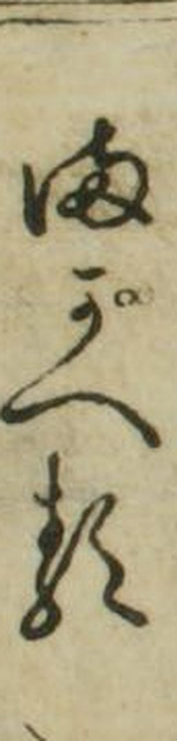まがへる
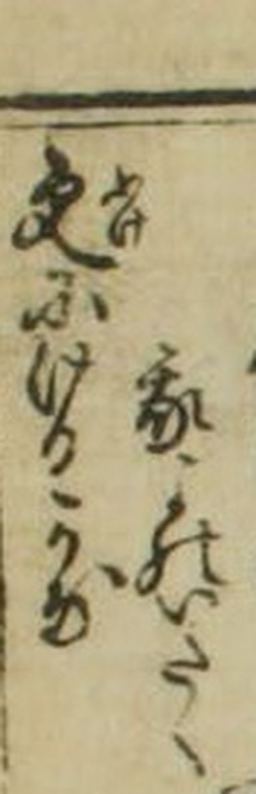更にけるかな
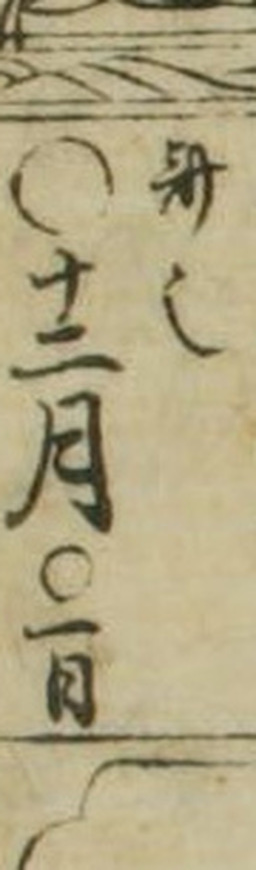○十二月○一日
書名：女源氏教訓鑑
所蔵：東京学芸大学附属図書館
